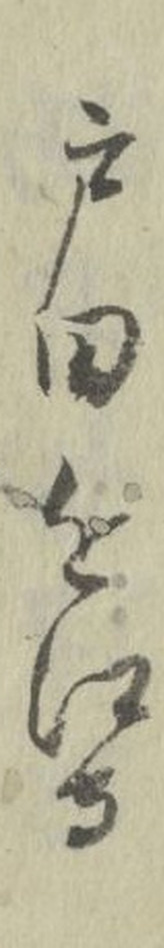同断戸田近江守
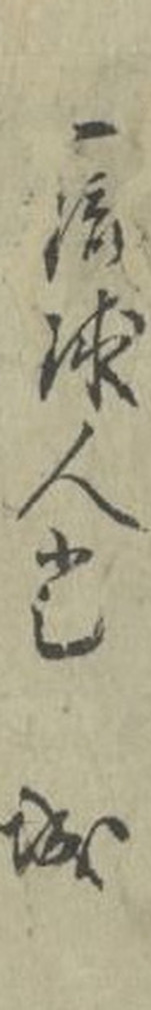一琉球人登城
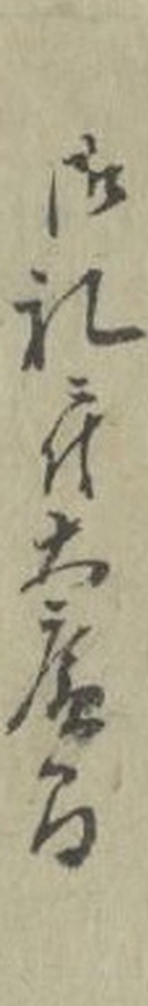御礼に付大広間
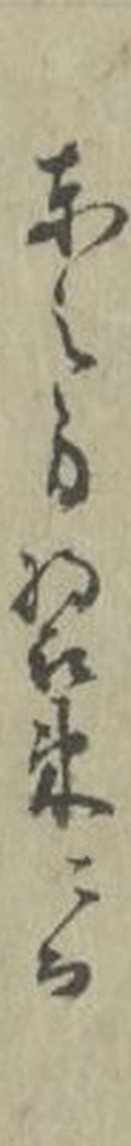東之方装束に而
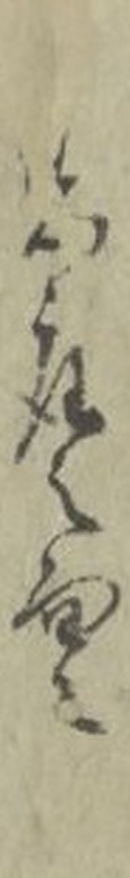着座之面々
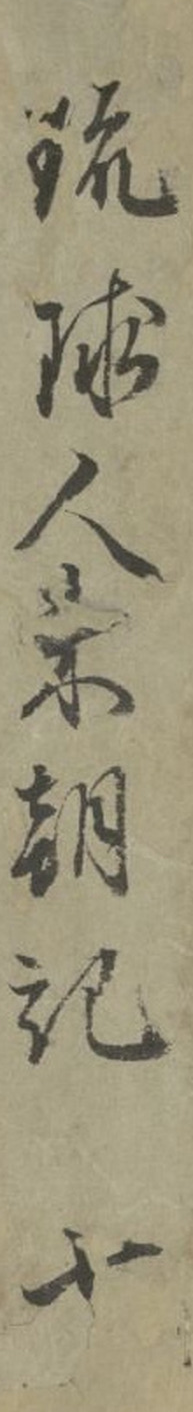琉球人来朝記七

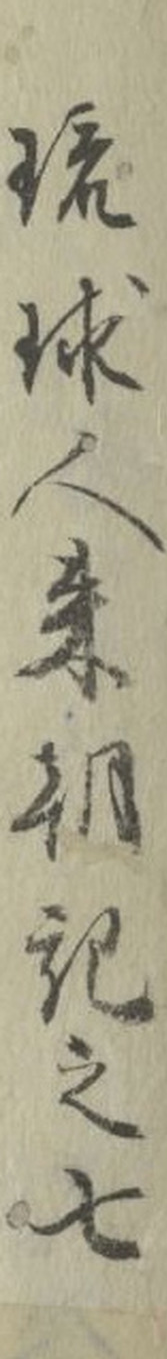琉球人来朝記之七
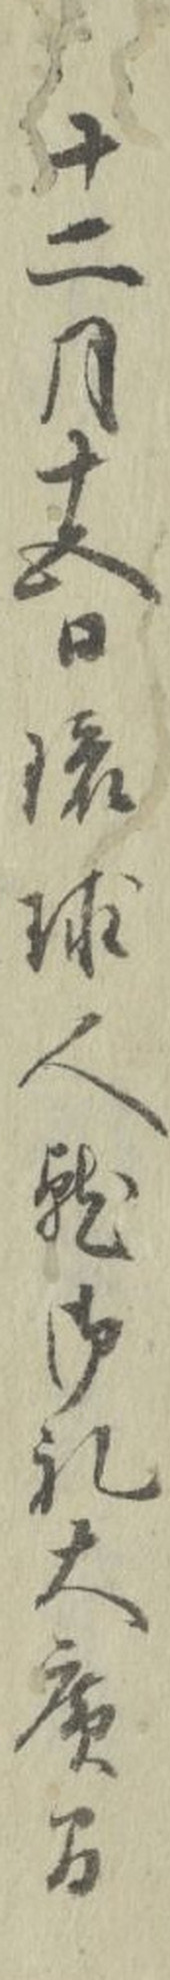一十二月十五日琉球人就御礼大広間
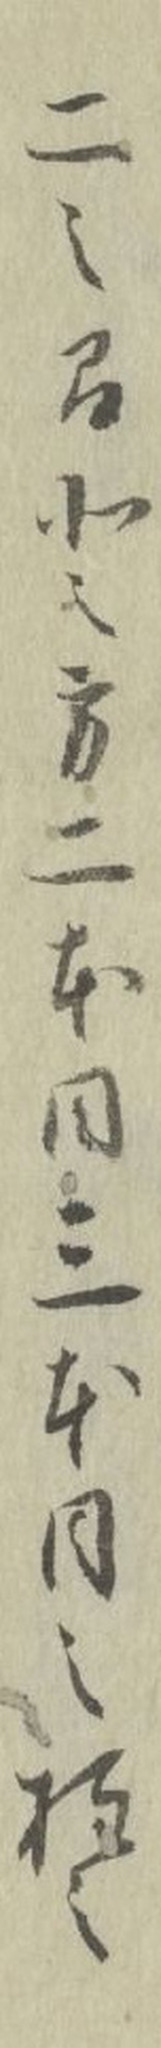二之間北之方二本目三本目之柱之
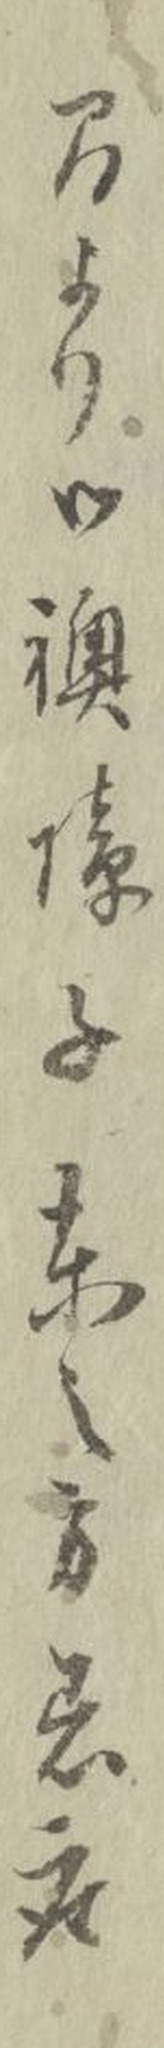間より御襖障子東之方着座
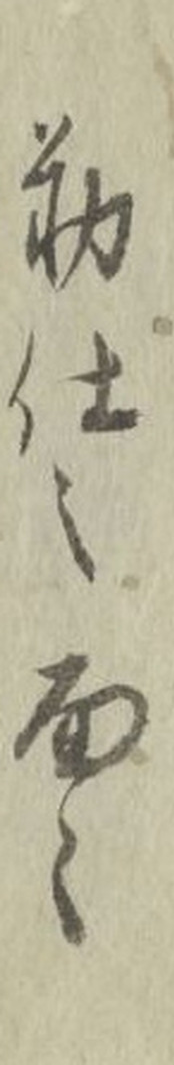勤仕之面々
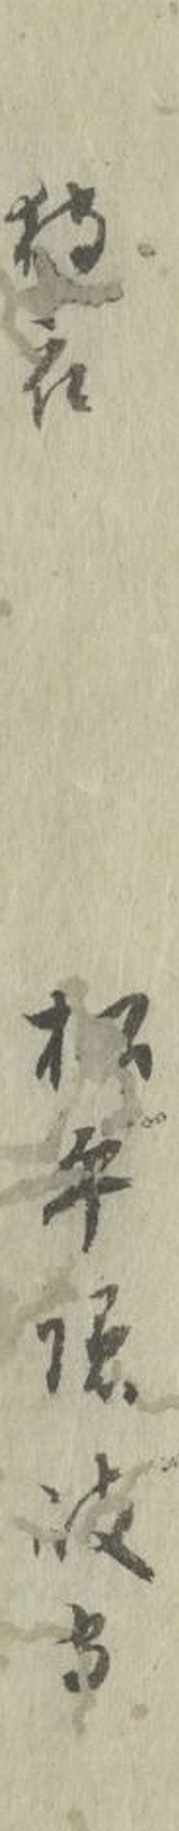狩衣松平隠岐守
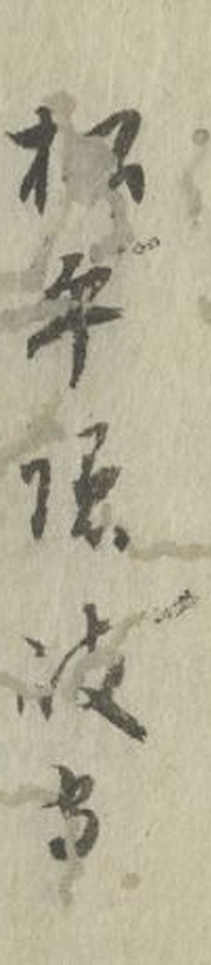狩衣松平隠岐守

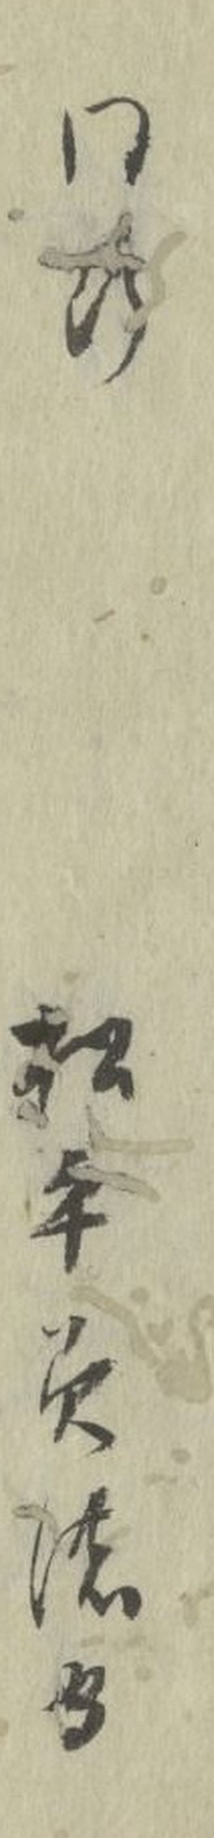同断松平美濃守
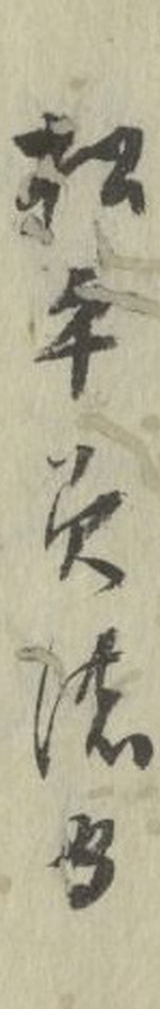同断松平美濃守
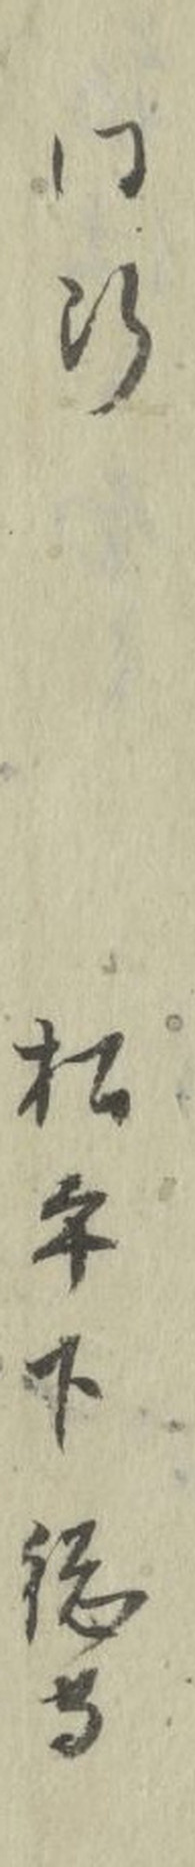同断松平下総守
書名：琉球来朝記 自一至七
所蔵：University of the Ryukyus Library
